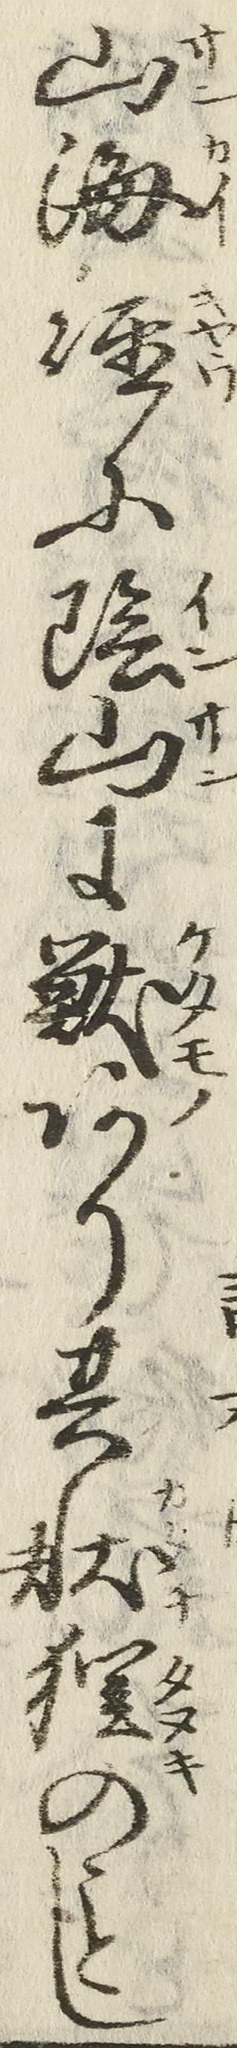山海経に陰山に獣あり其状狸のことし
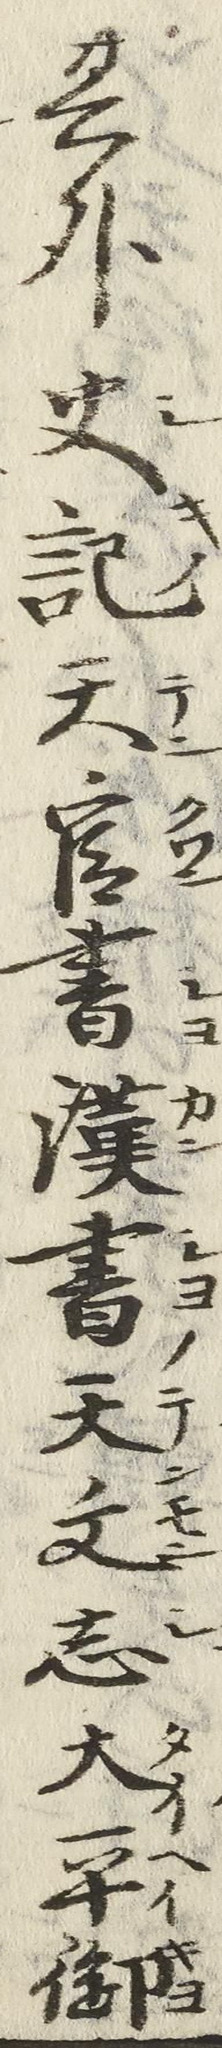其外史記天官書漢書天文志大平御
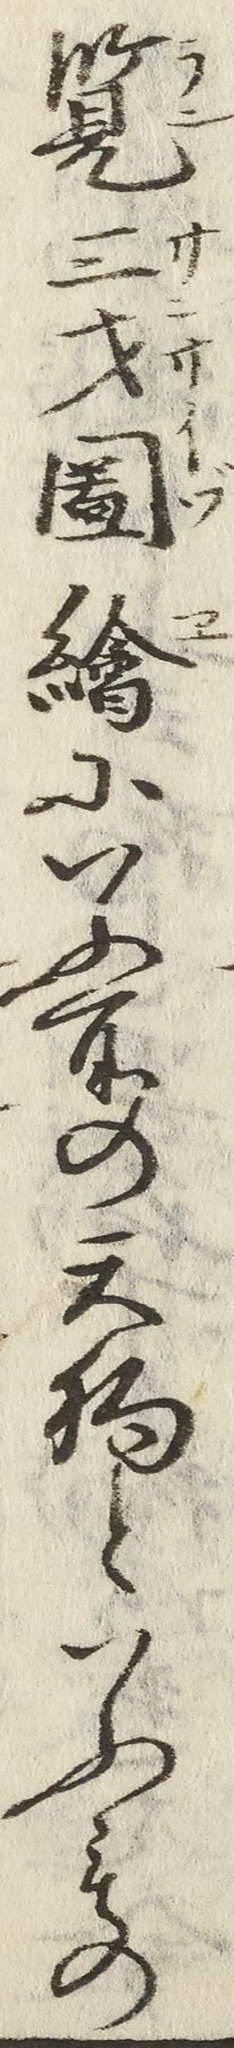覧三才図絵にいふ所の天狗といふもの
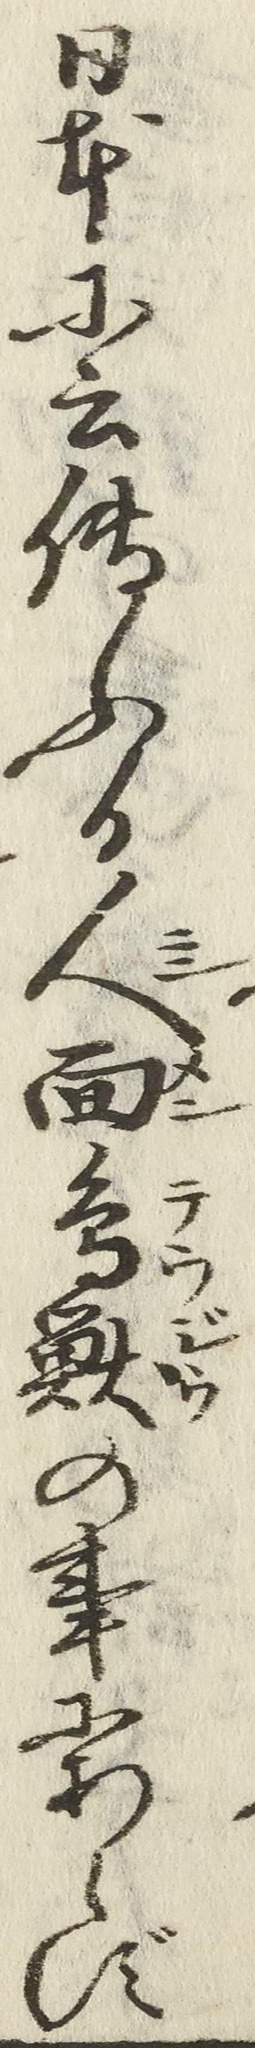日本に云伝ふる人面鳥獣の事ニあらず
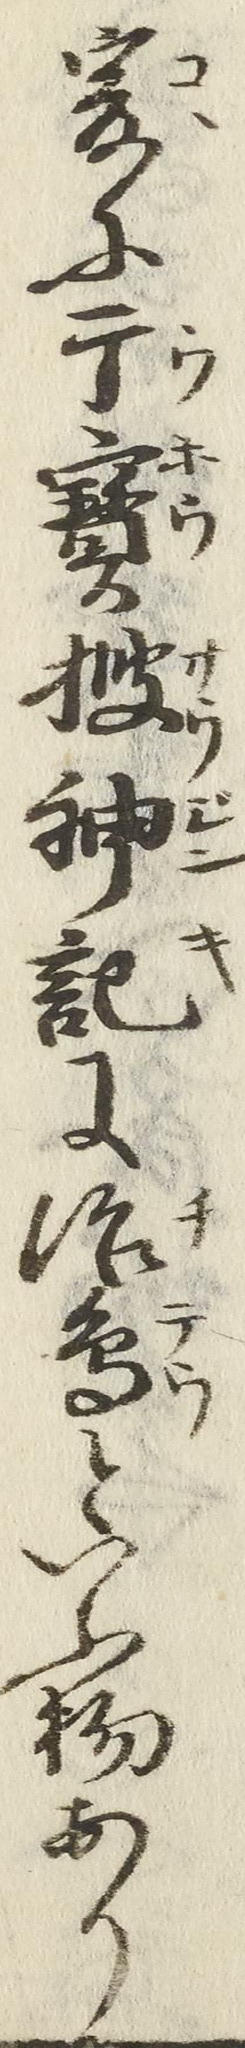爰に于宝捜神記に治鳥という物あり
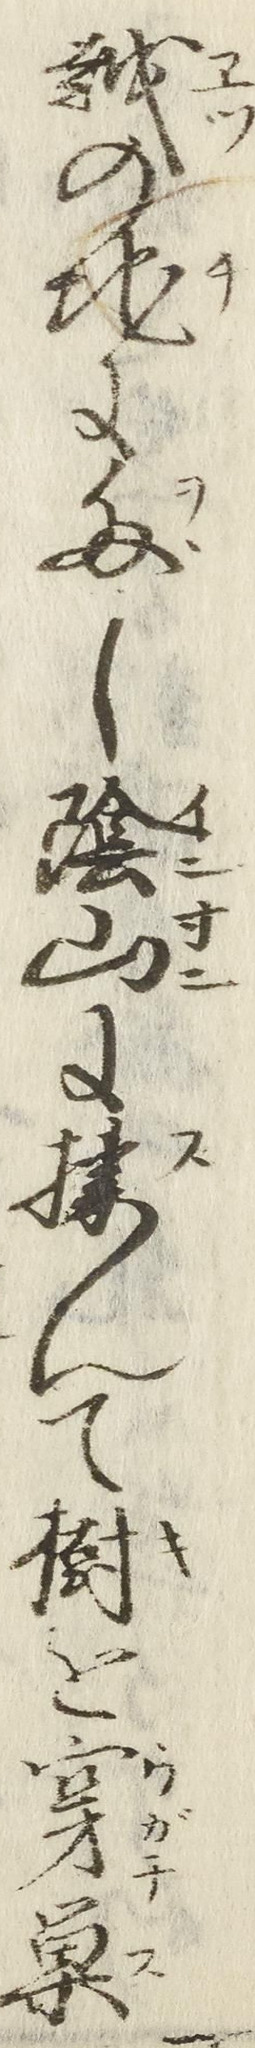越の地に多し陰山に棲んて樹を穿巣
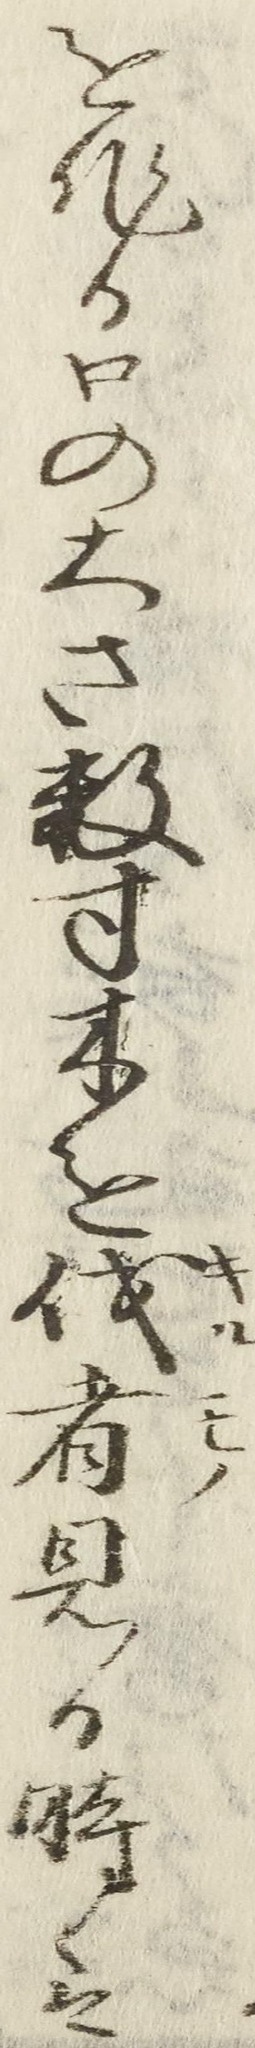を作る口の大さ数寸木を伐者見る時は
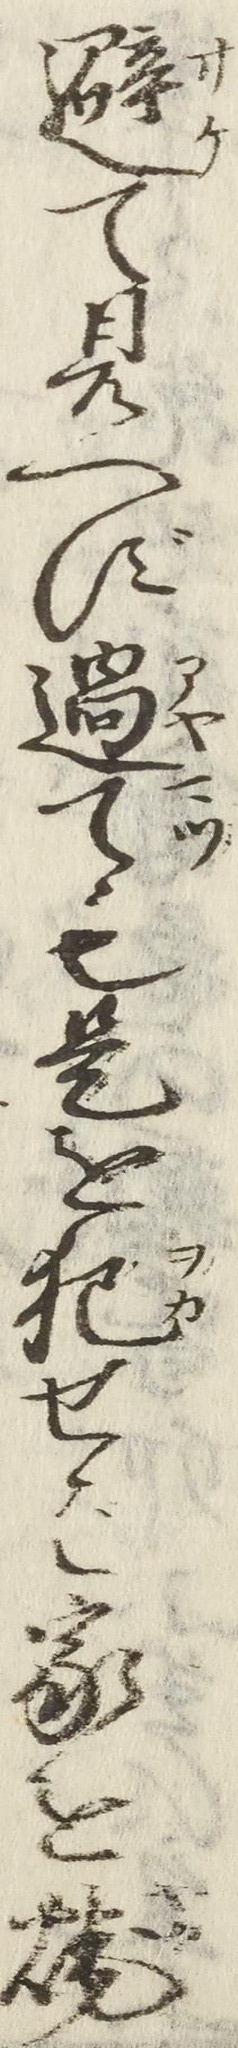避て見へず過ても是を犯せば？家を焼
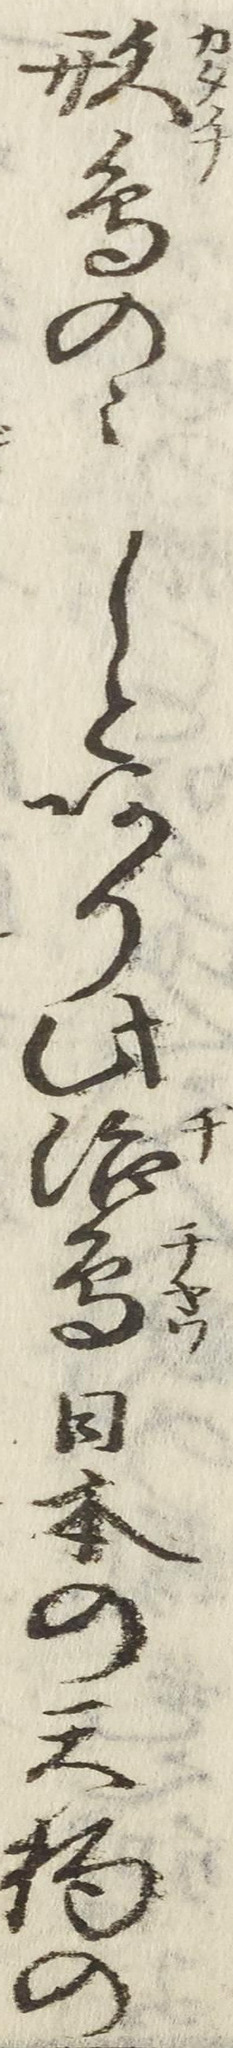形鳥のこと？しとあり此治鳥日本の天狗の
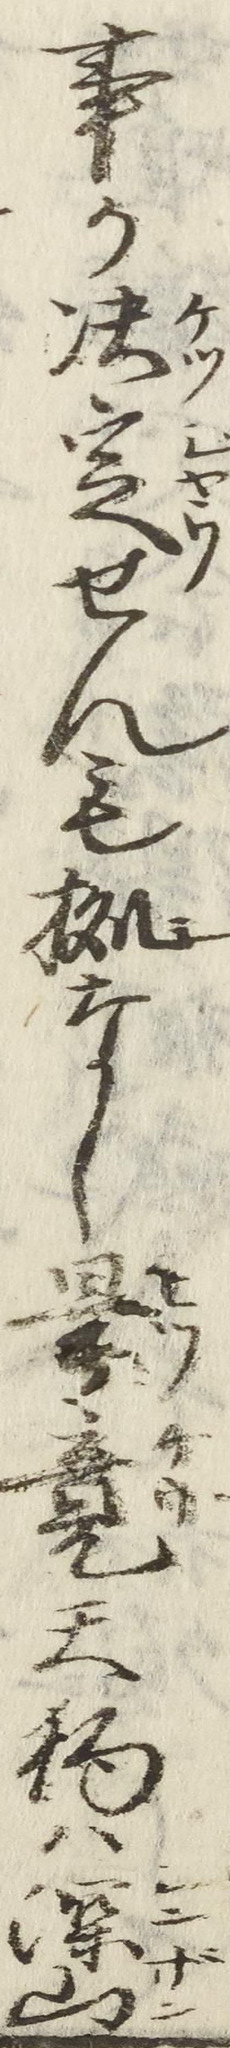事か決定せんも拠なし畢竟天狗は深山
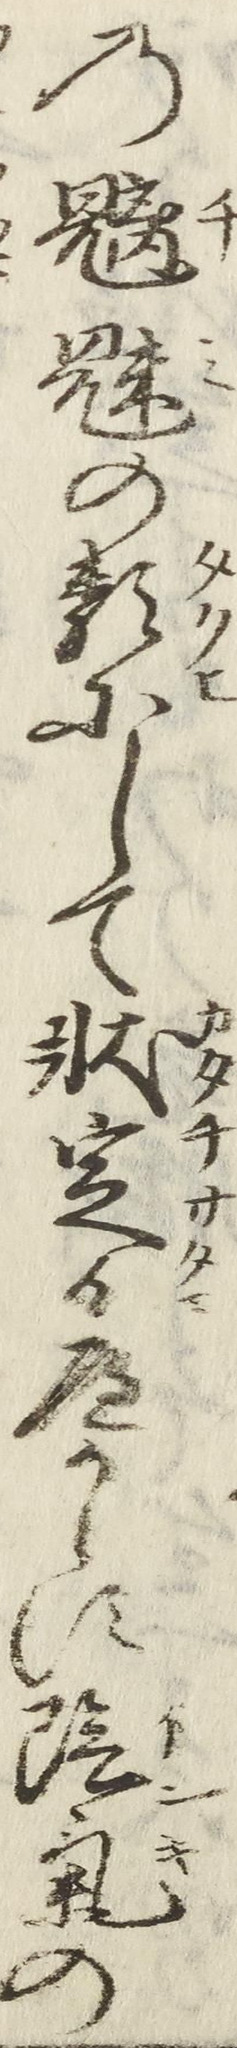の魑魅の類にして状定るへからす陰気の
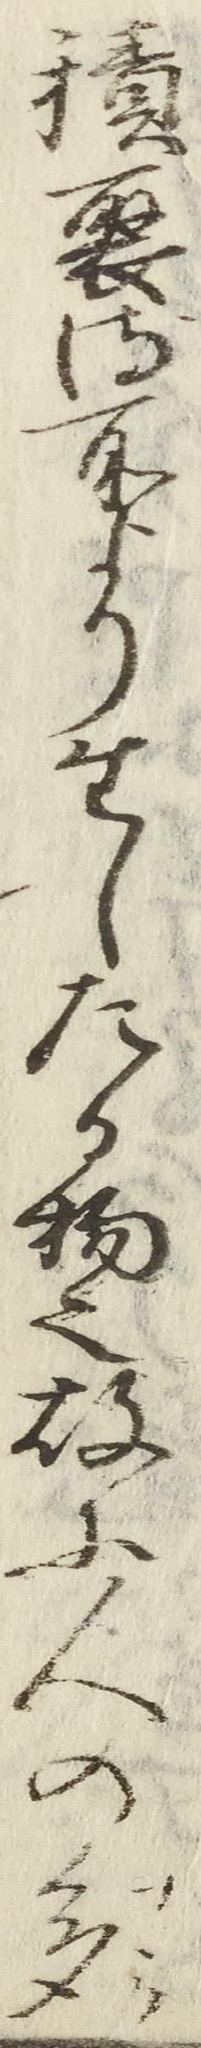積聚る所より生したる物也故に人の多
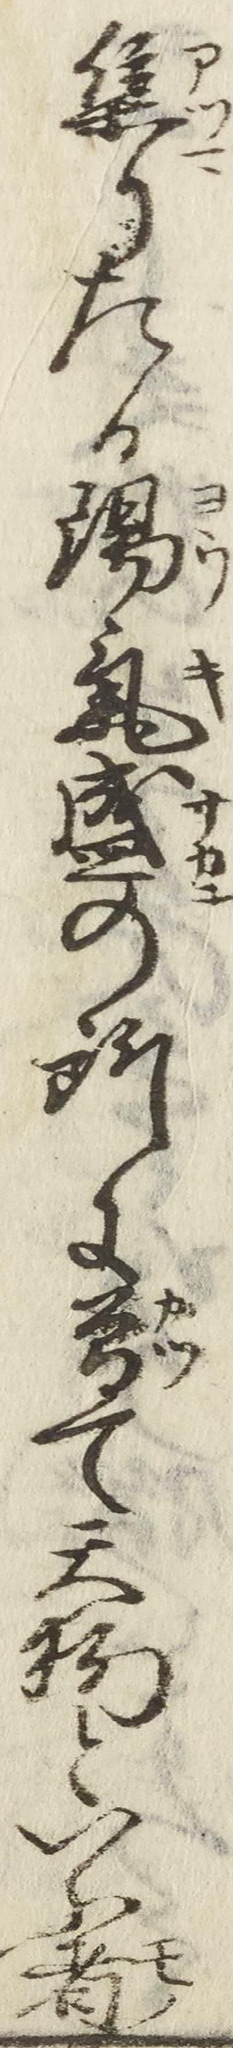集りたる陽気盛の所に曽て天狗といふ者

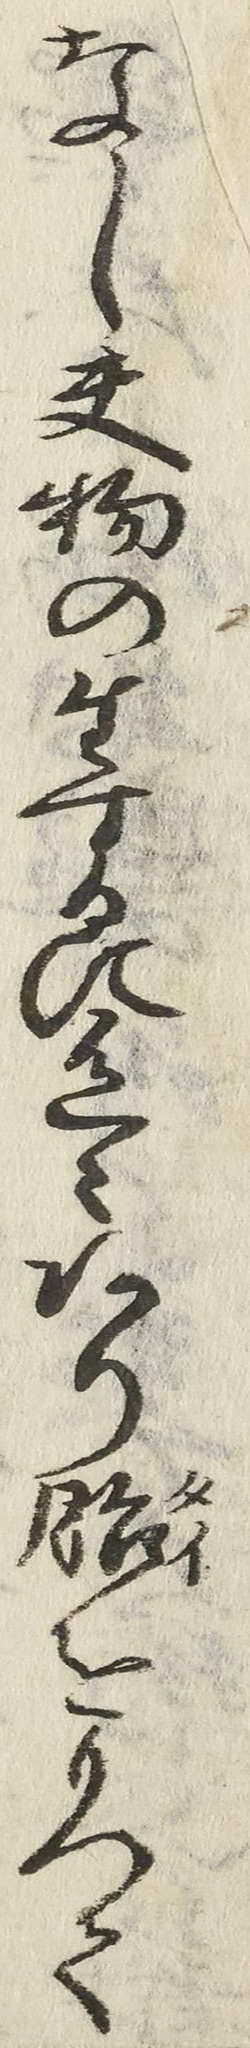なし夫物の生するに色々あり胎をもつて
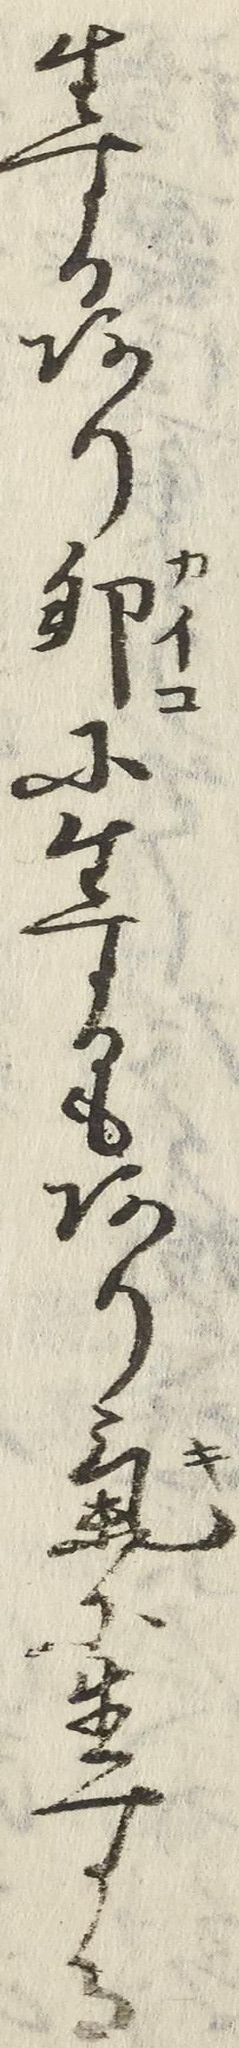生するあり卵に生するもあり気に生する
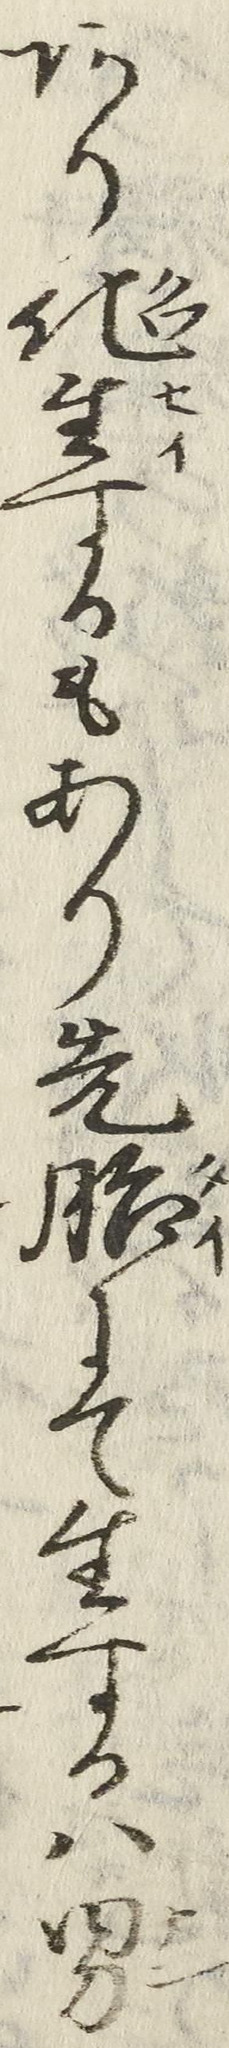あり化生するもあり先胎にて生するは男
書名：天地或問珍　地
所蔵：東京大学地震研究所図書室 Earthquake Research Institute Library, The University of Tokyo, JAPAN
